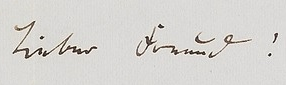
Lieber Freund!
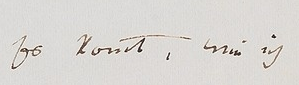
Es kommt, wie ich
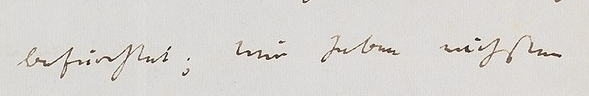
befürchtet; wir haben nächsten
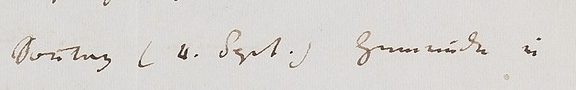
Sonntag (4. Sept.) Gemeinde in
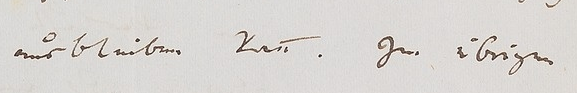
ausbleiben kann. Im übrigen
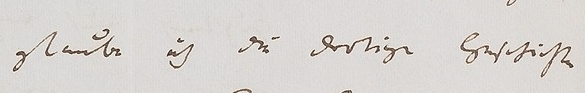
glaube ich die dortige Geschichte
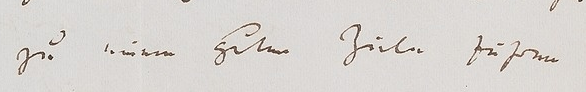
zu meinen guten Zielen führen
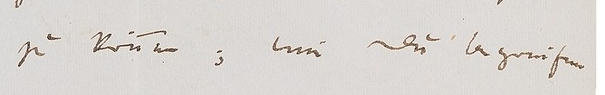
zu können; wie Du begreifen
